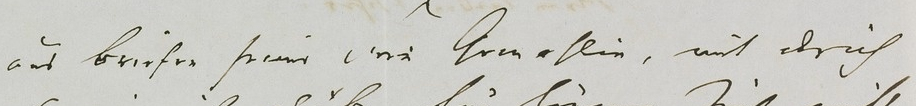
aus Briefen seiner Frau Gemahlin, mit der ich
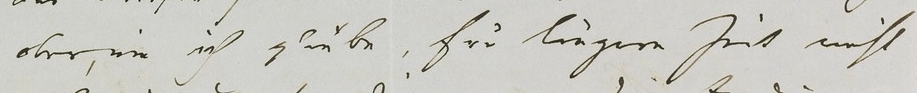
aber, wie ich glaube, für längere Zeit nicht
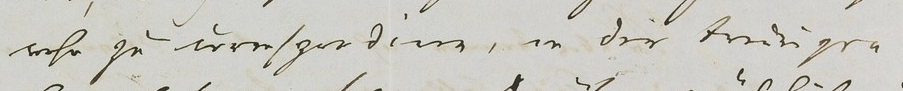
mehr zu correspondiren, in der traurigen
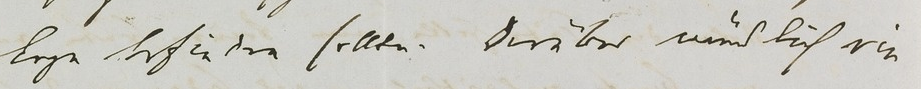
Lage befinden sollte. Darüber mündlich ein
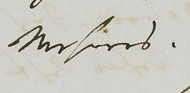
Mehrers.
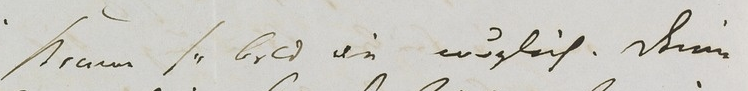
Komme so bald wie möglich. Deine
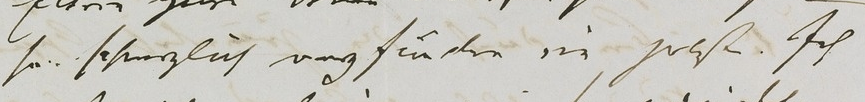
so schmerzlich empfunden wie jetzt. Ich
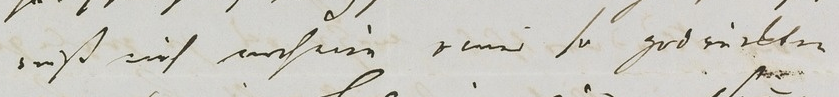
weiß mich noch nie einer so gedrückten
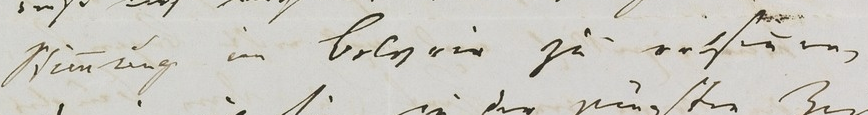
Stimmung im Belvoir zu entsinnen,
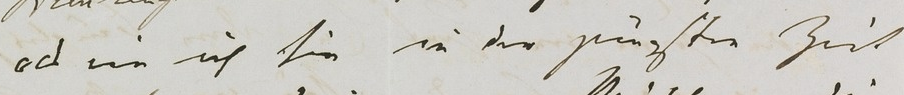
als wie ich sie in der jüngsten Zeit
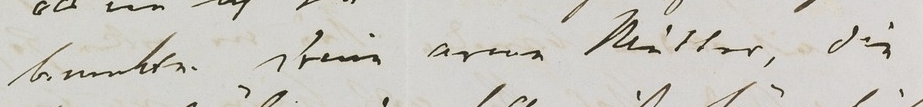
bemerkte. Deine arme Mutter, die
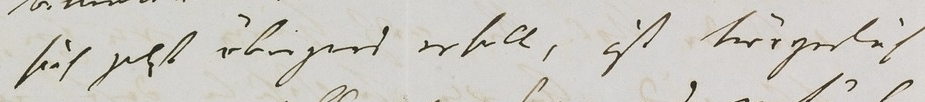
sich jetzt übrigens erholt, ist körperlich
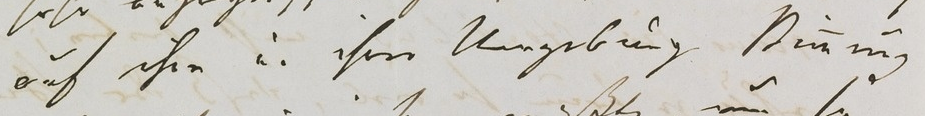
auf ihre u. ihrer Umgebung Stimmung
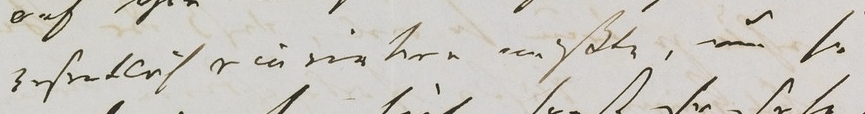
wesentlich einwirken mußte, um so
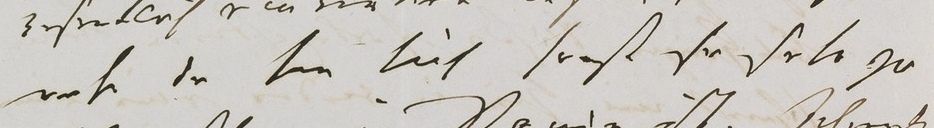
mehr da sie sich sonst so sehr zu
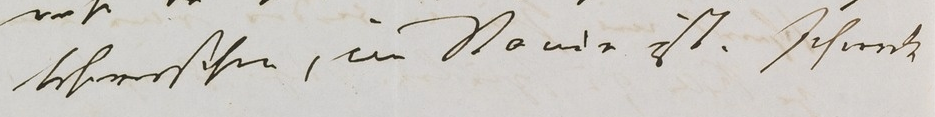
beherrschen, im Stande ist. Ich werde
